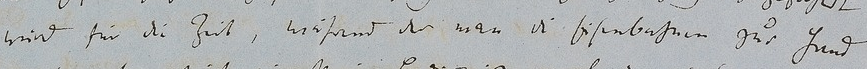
wird für die Zeit, während der man die Eisenbahnen zur Hand
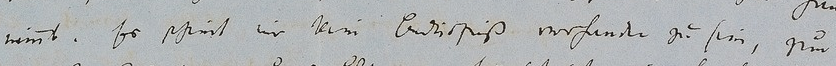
nimmt. Es scheint mir kein Bedürfniß vorhanden zu sein, zum
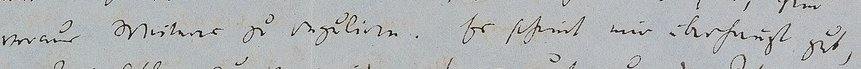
voraus Weiteres zu reguliren. Es scheint mir überhaupt gut,
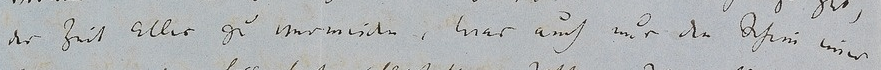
der Zeit alles zu vermeiden, was auch nur den Schein einer
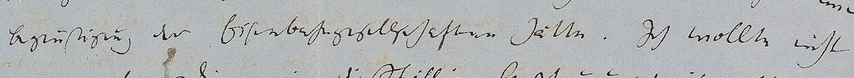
Begünstigung der Eisenbahngesellschaften hätte. Ich wollte nicht
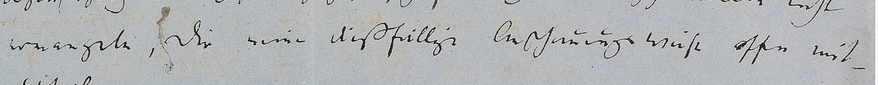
ermangeln, Dir meine dießfällige Anschauungsweise offen mit-
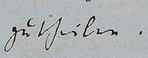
zutheilen.
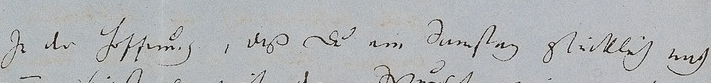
In der Hoffnung, daß Du am Samstag glücklich nach
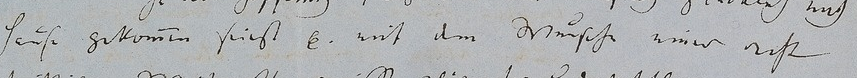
Hause gekommen seiest &. mit dem Wunsche einer recht
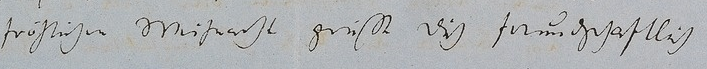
fröhlichen Weihnacht grüßt Dich freundschaftlich
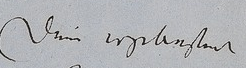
Dein ergebenster
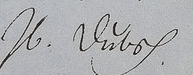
Jb. Dubs.
